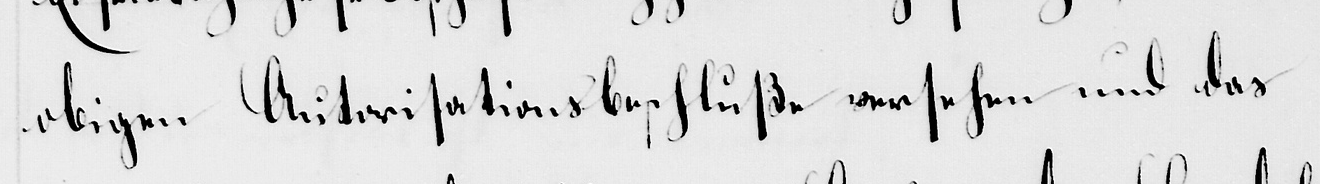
obigen Autorisationsbeschluße versehen und das
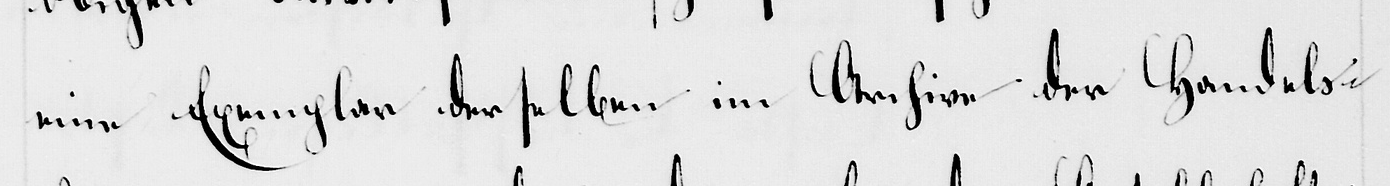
eine Exemplar derselben im Archive der Handels¬
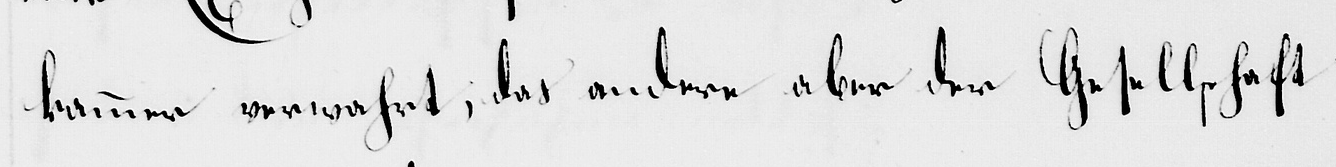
kammer verwahrt; das andere aber der Gesellschaft
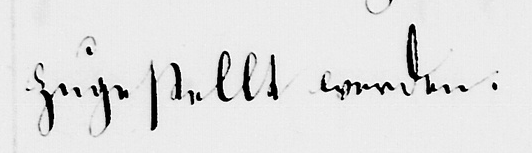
zugestellt werden.
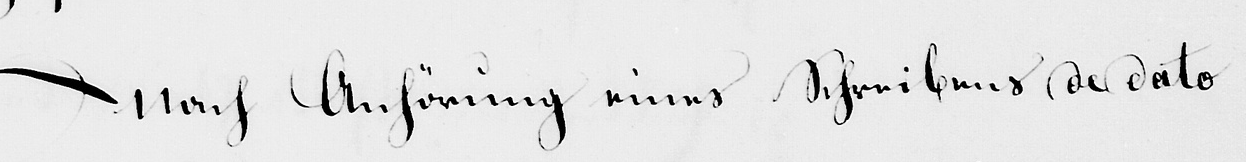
Nach Anhörung eines Schreibens de dato
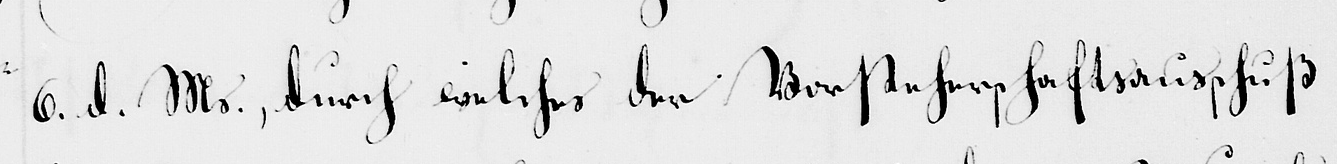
6. d. Ms., durch welches der Vorsteherschaftsausschuß
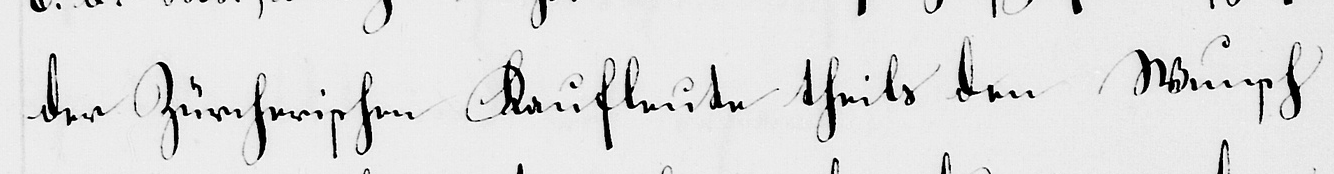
der Zürcherischen Kaufleute theils den Wunsch
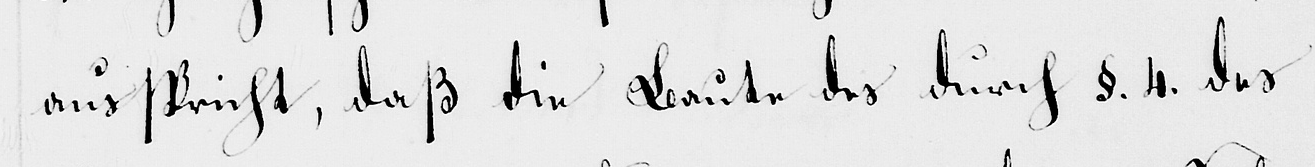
ausspricht, daß die Baute des durch §. 4. des
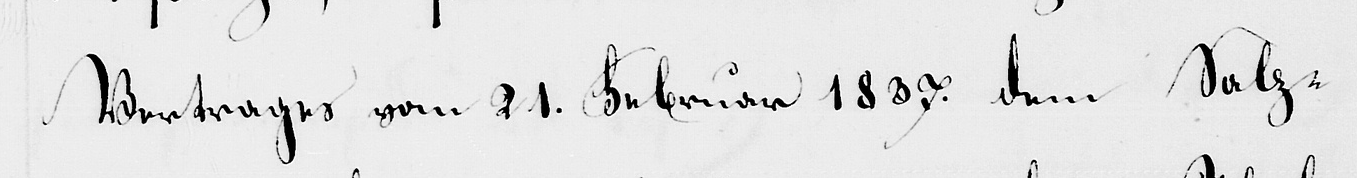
Vertrages vom 21. Februar 1837. dem Salz¬
